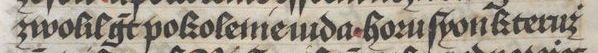zwolil ḡt pokolenie uida.horu ſyon kteruż
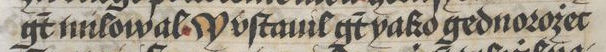ḡt milowal.Y vſtauil ḡt yako gednorożec
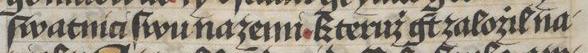ſwatnici ſwu na zemi.Kteruż ḡt zalożil na
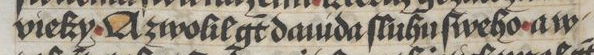vieky.A zwolil ḡt dauida ſluhu ſweho.a w¬
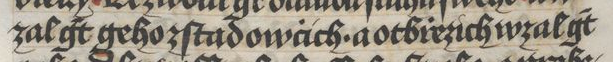zal ḡt geho zſtad owċich.a otbṙezich wzal ḡt
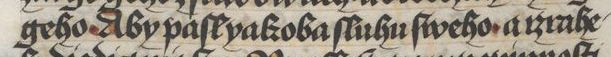geho.Aby paſl yakoba ſluhu ſweho.a izrahe¬
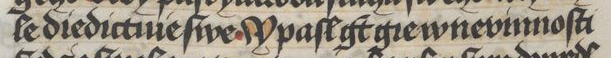le diedictuie ſwe.Ypasſl ḡt gie wnevinnoſti
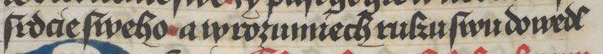ſrdcie ſweho.a wrozumiech ruku ſwu dowedl
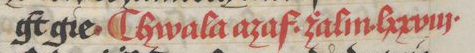ḡt.Chwala azaf.żalm.lxxviii.
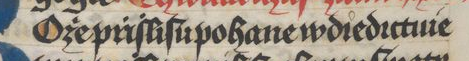Ože pṙiẛliſu pohane wdiedictuíe
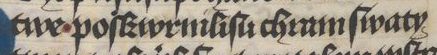twe.poẛkwrniliſu chram ſwaty
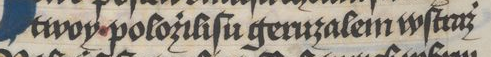twoy.polożiliſu geruzalem wſtraż
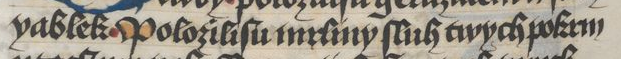yablek.Polożili ſu mrliny ſluh twych pokrm
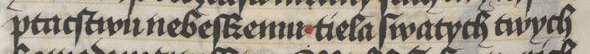ptacſtwu nebeſkemu.tiela ſwatych twych
